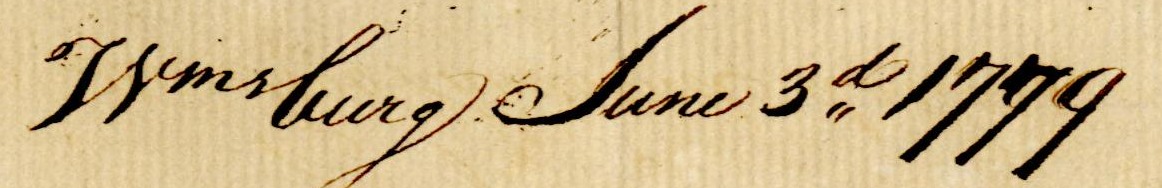W^msburg June 3^d. 1779
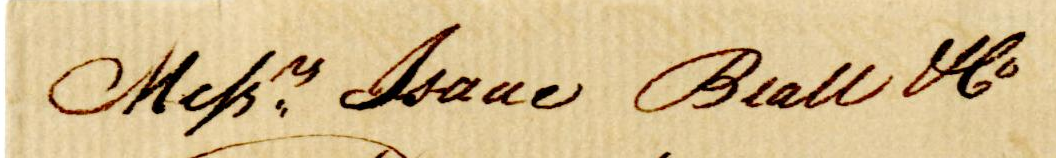Mess^rs. Isaac Beall & C^o
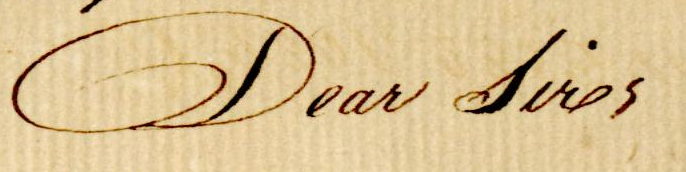Dear Sirs
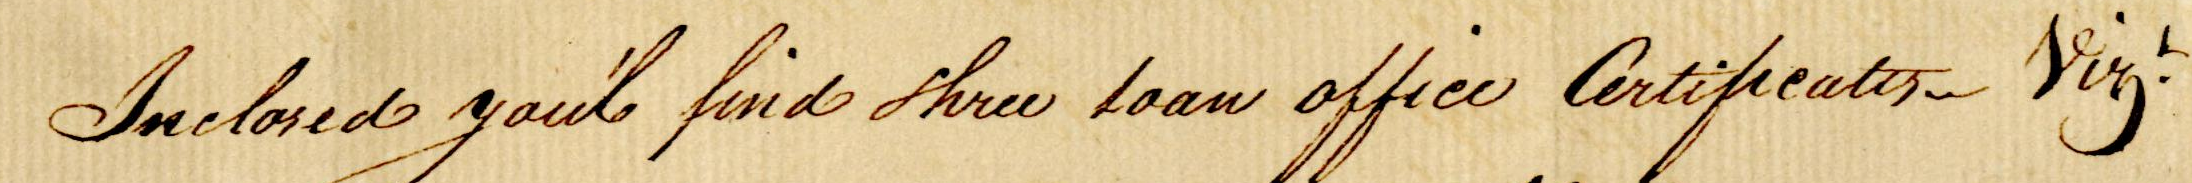Inclosed you'l find three loan office Certificates Viz^t.
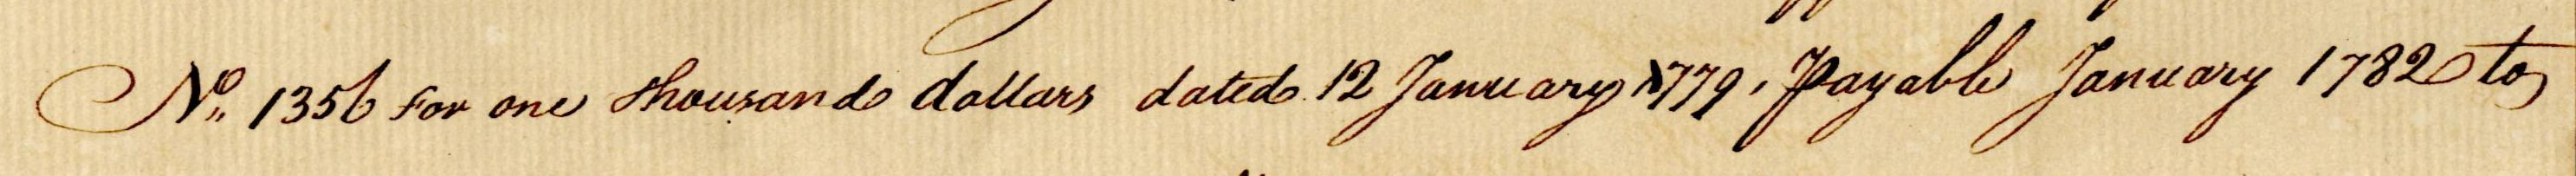N^o. 1356 for one thousand dollars dated 12 January 1779 payable January 1782 to
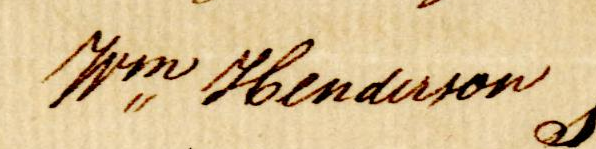W^m. Henderson
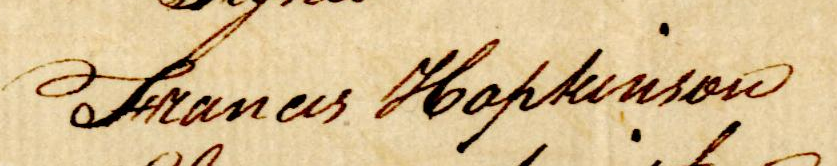Frances Hopkinson
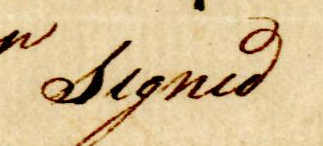Signed
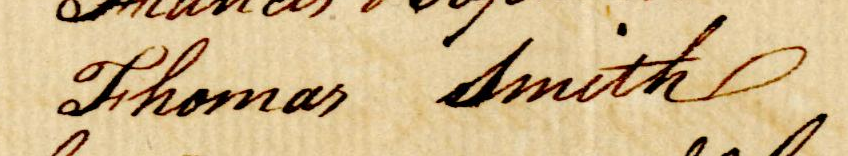Thomas Smith
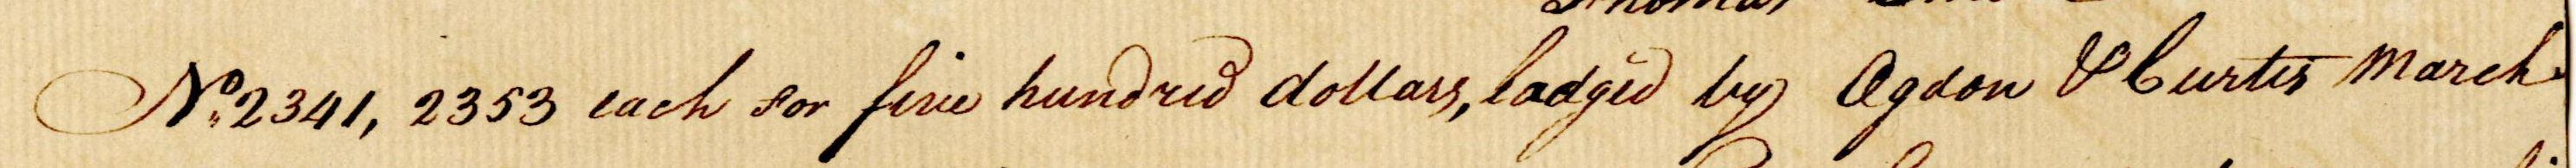N^o. 2341, 2353 each for five hundred dollars, lodged by Agdon & Curtis March
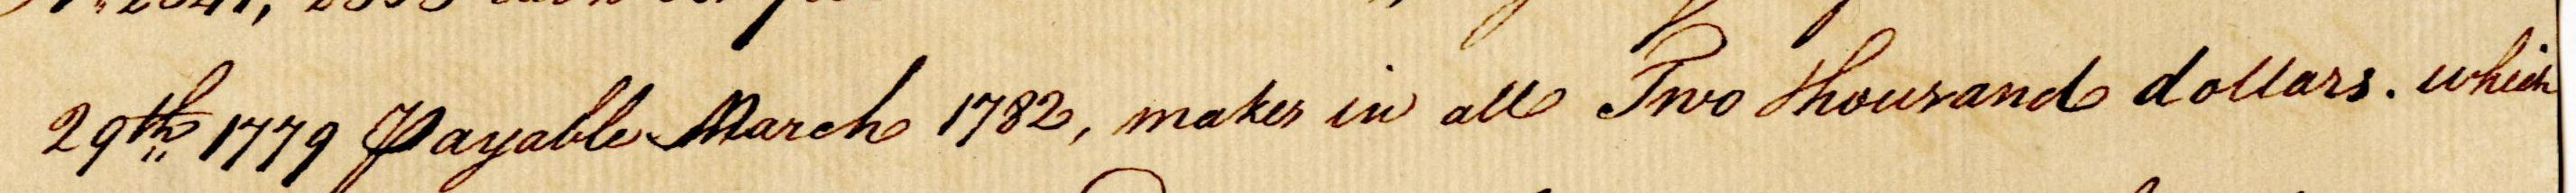29th. 1779 payable March 1782, makes in all Two thousand dollars. which
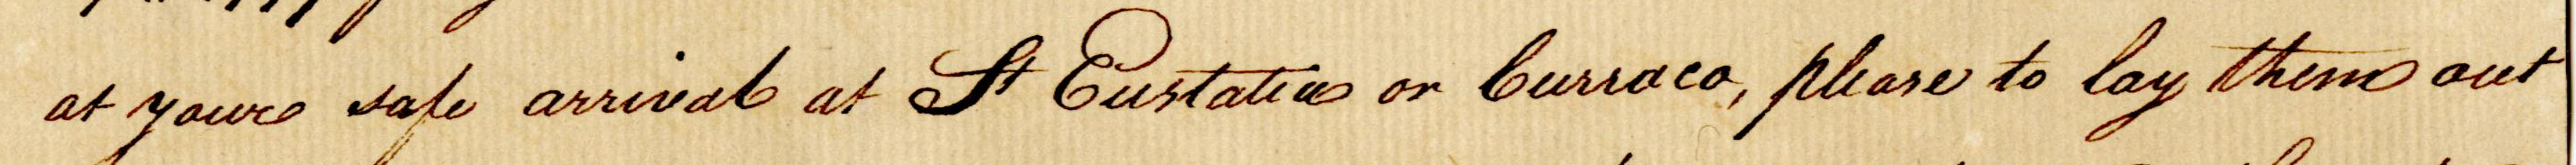at your safe arrival at S^t Eustatia or Curraco, please to lay them out
